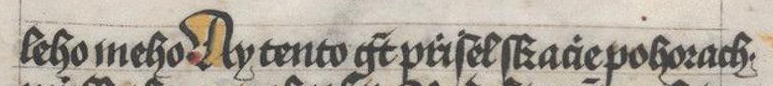leho meho. Ay tento ḡt pṙiẛel ſkaċie pohorach.
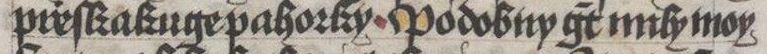pṙeſkakuge pahorky. Podobny ḡt mily móy
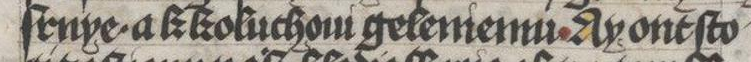ſrnye. a k koluchoui geleniemu. Ay onť ſto¬
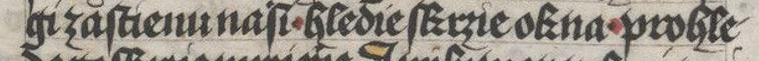gí zaſtienu naẛí.hledie ſkrzie okna.prohle¬
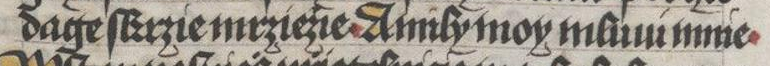dage ſkrzie mrzíeżie.Amilý moy mluuí mníe.
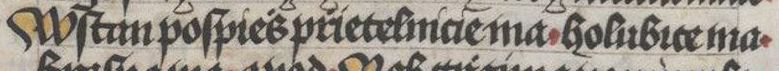Wſtan poſpieṡ pṙíetelnicie má.holubice ma.
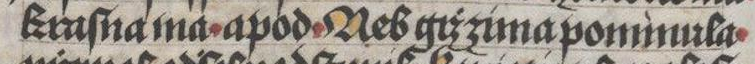kraſna ma.apod.Neb giż zíma pominula.
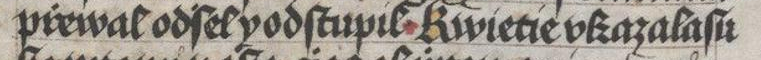pṙewal odẛel y odſtupil.Kwietie vkazalaſu
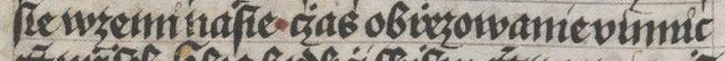ſie wzemi naẛíe.cżas obṙezowaníe vinnic
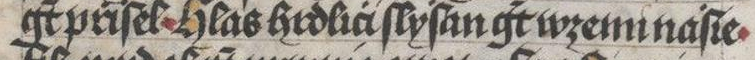ḡt pṙiẛel. Hlas hrdliċí ſlyẛán ḡt wzemi naẛie.
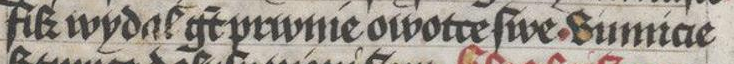fik wydal ḡt prwníe owotce ſwe.Vinnicie
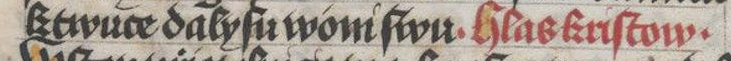ktwuce dalyſu wóni ſwu. Hlas kriſtow.
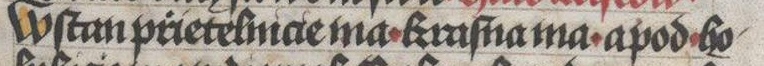Wſtan pṙíetelnicie ma.kraſna ma.a pod.ho¬
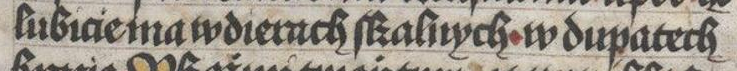lubicie ma wdierach ſkalnych.w dupatech
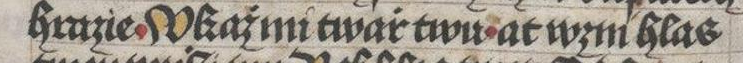hrazie.Ukaż mi twaṙ twú.at wzní hlas
